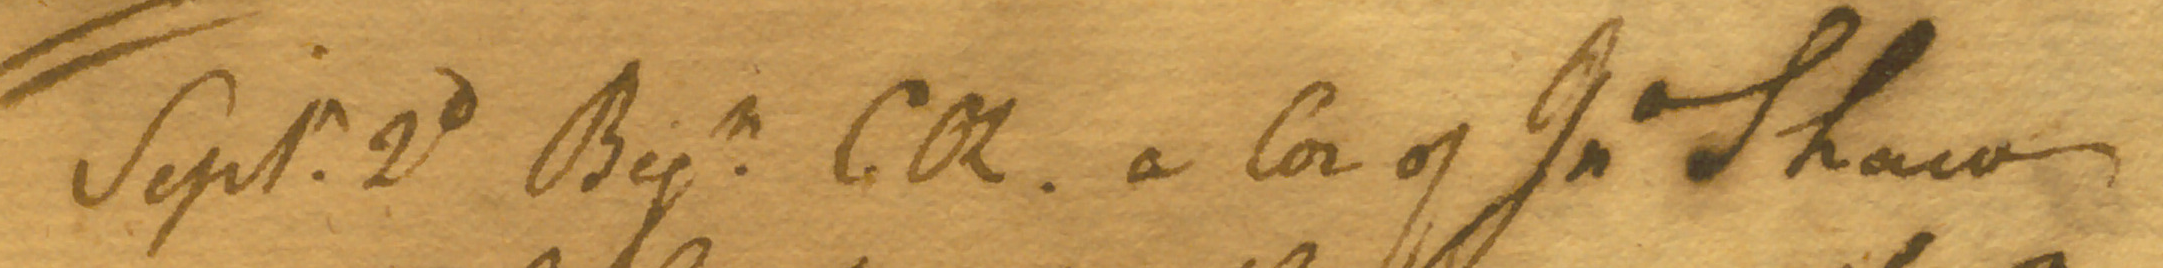Sept^r. 2^d Beg^n. C 0h a Cor of Jn^o Shaw
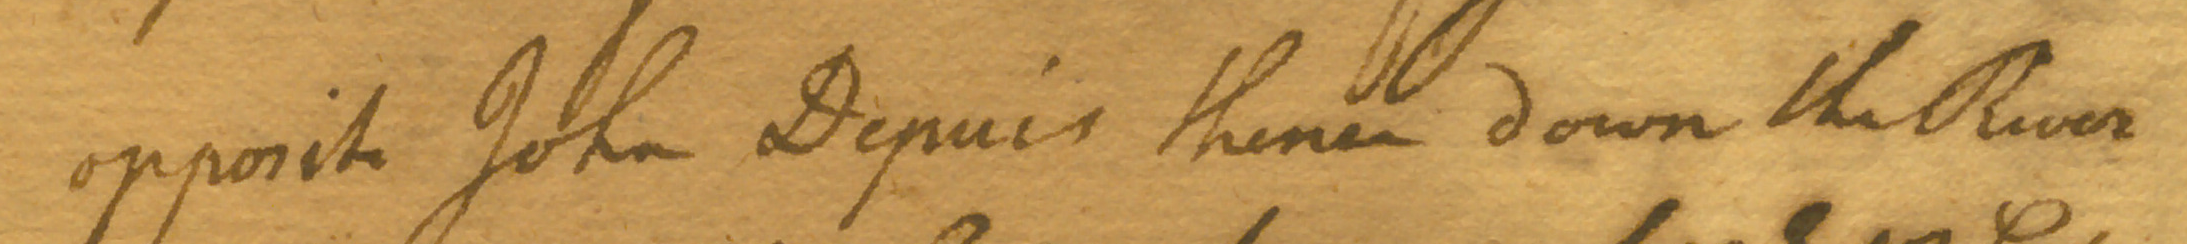opposite John Depuis thence down the River
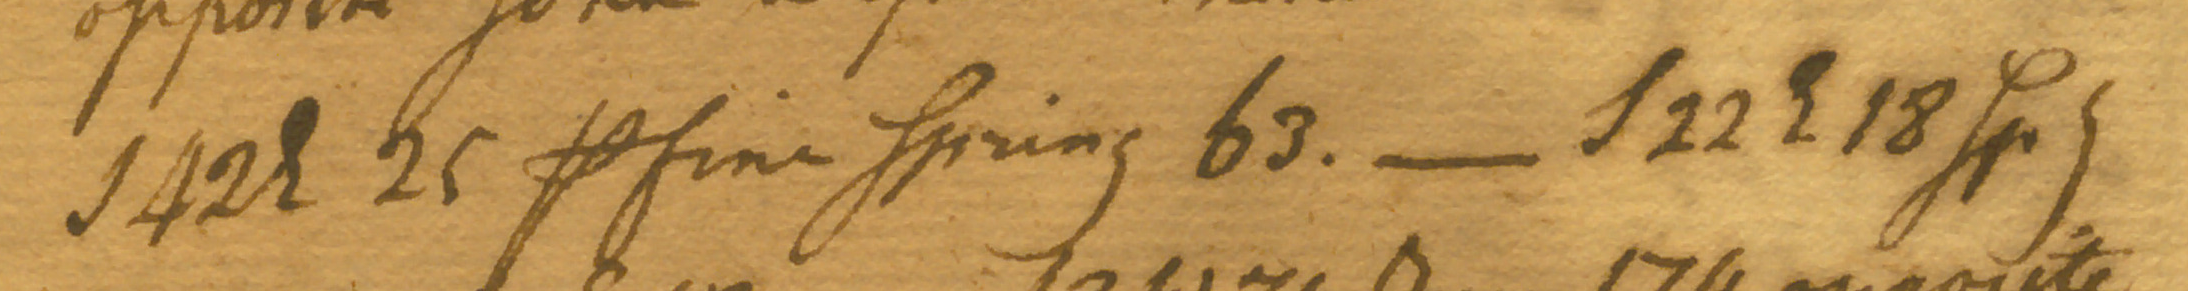S42E 25 per fine Spring 63.- S22 E 18 Sp^g
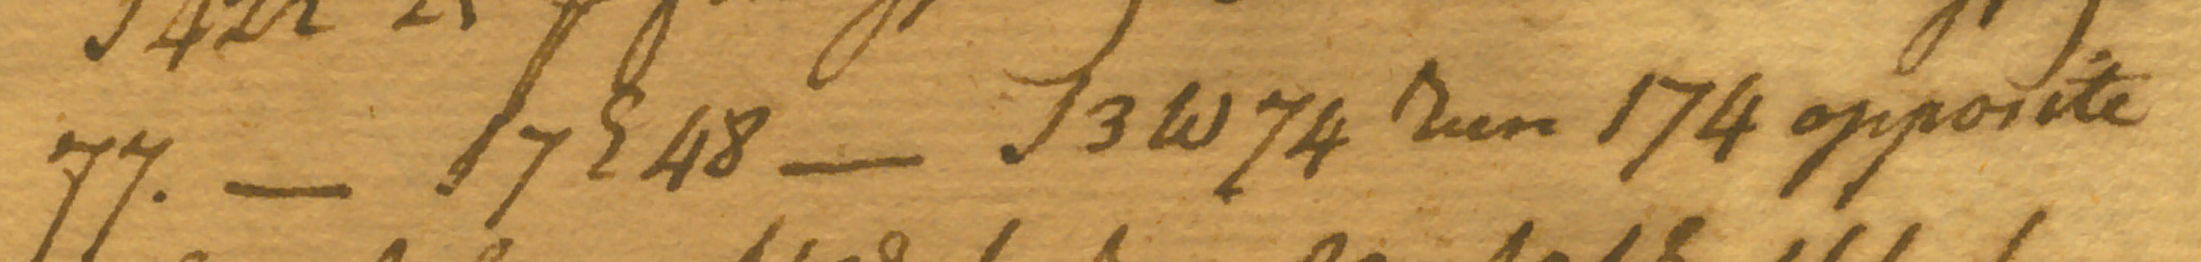77.- S7E48- S3W74 run 174 opposite
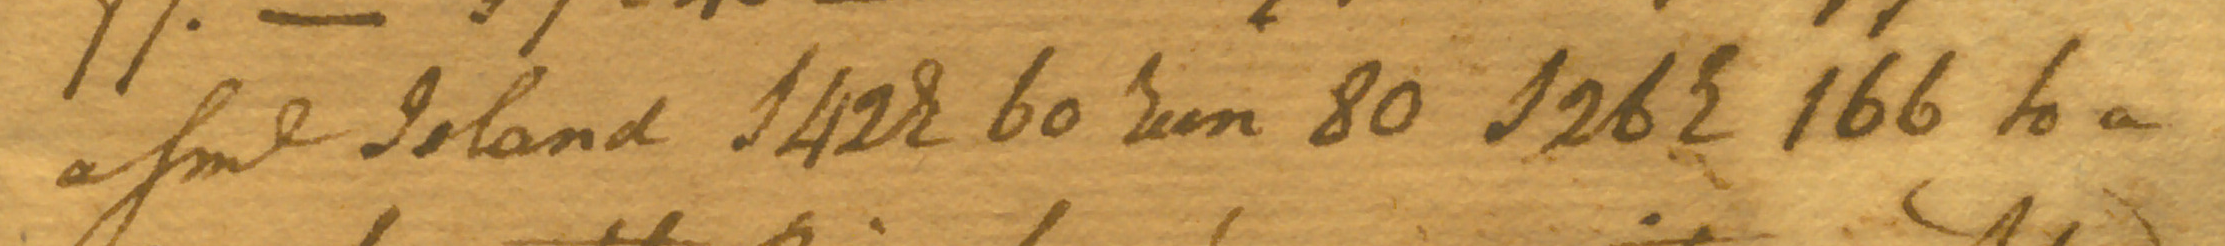a sml Island 242E 60 run 80 S26E 166 to a
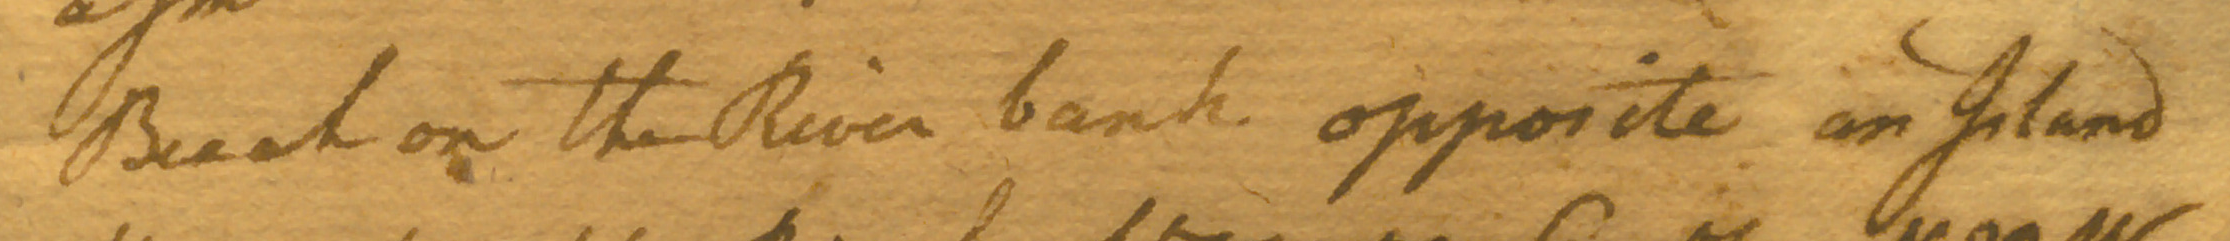Beach on the River bank opposite an Island
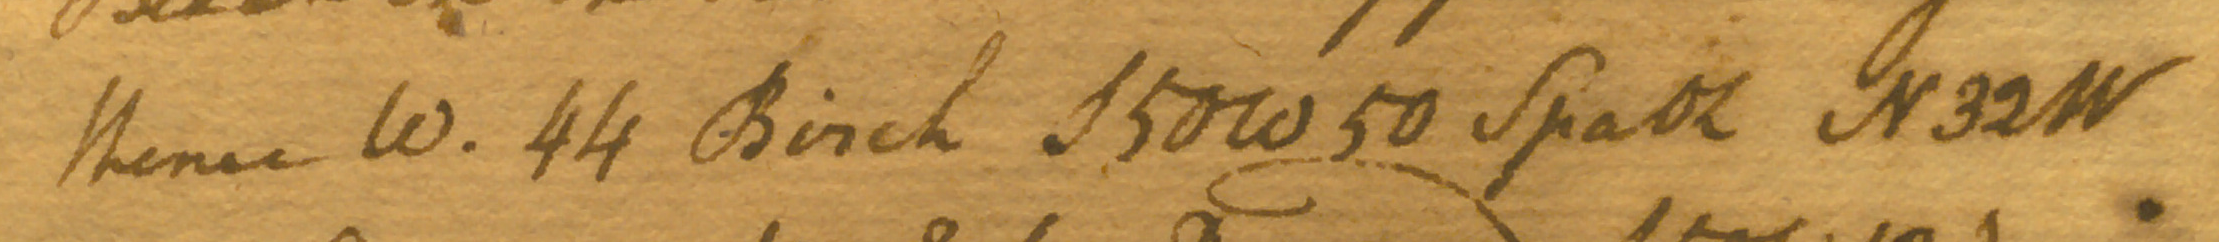thence W. 44 Birch S50W50 S path N32W
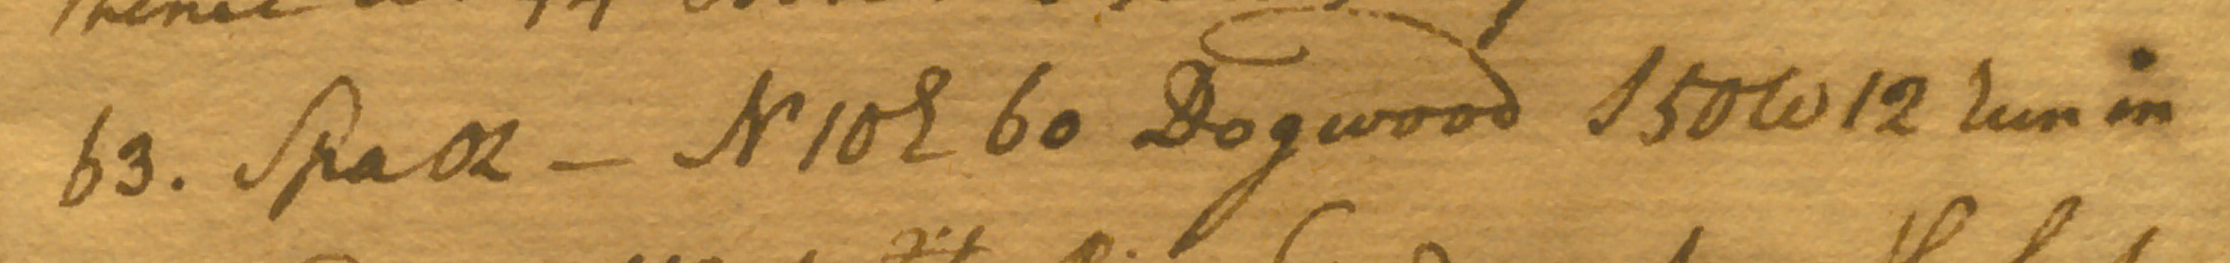63. Spa 0h- N10E 60 Dogwood S50W12 run in
